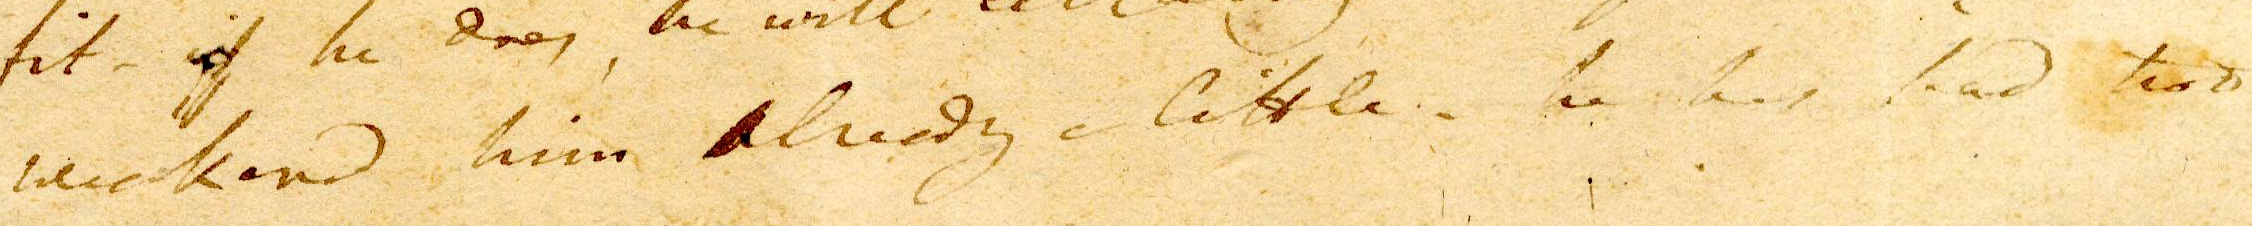weakened him Already a little. he has had bad
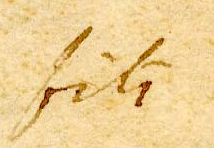fits.
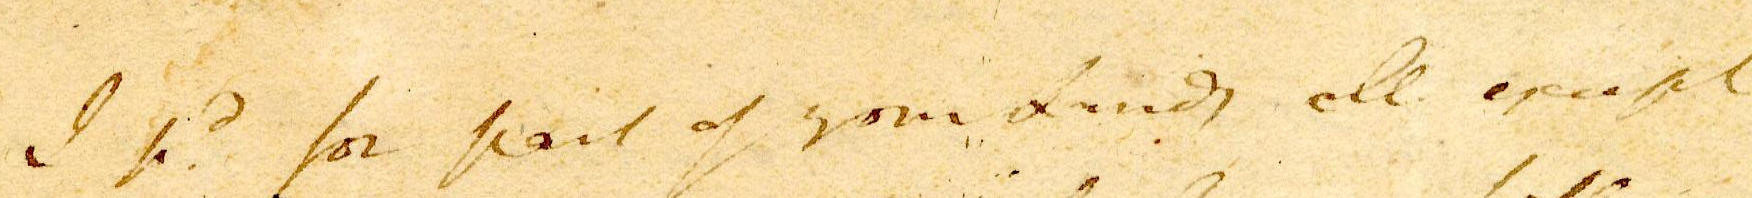I p^d. for part of your Lands all except
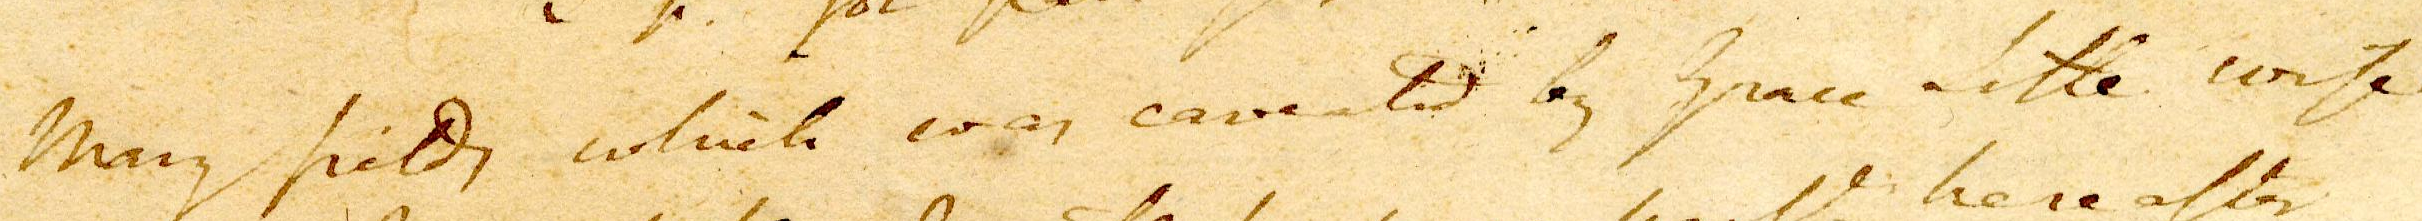Mary fields which was caveated by Grace Litle wife
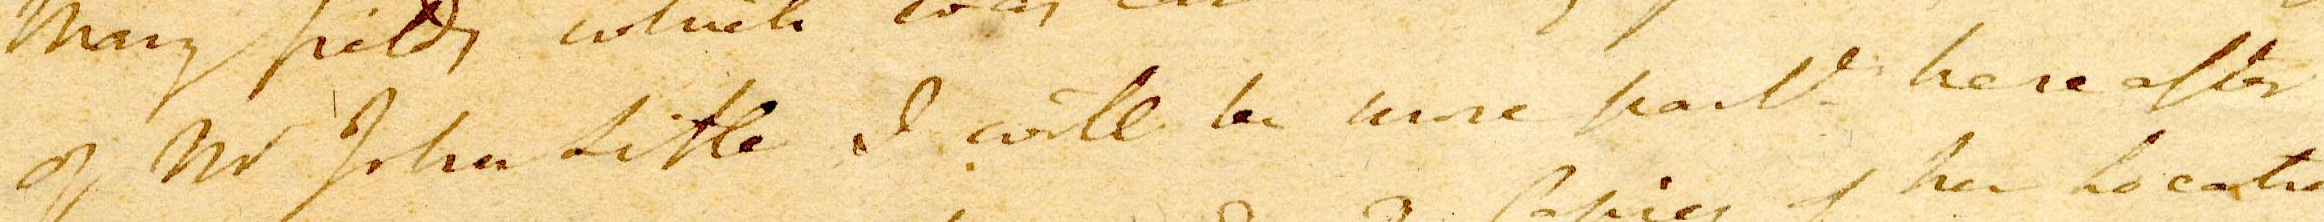of M^r John Litle I will be more part^l here after
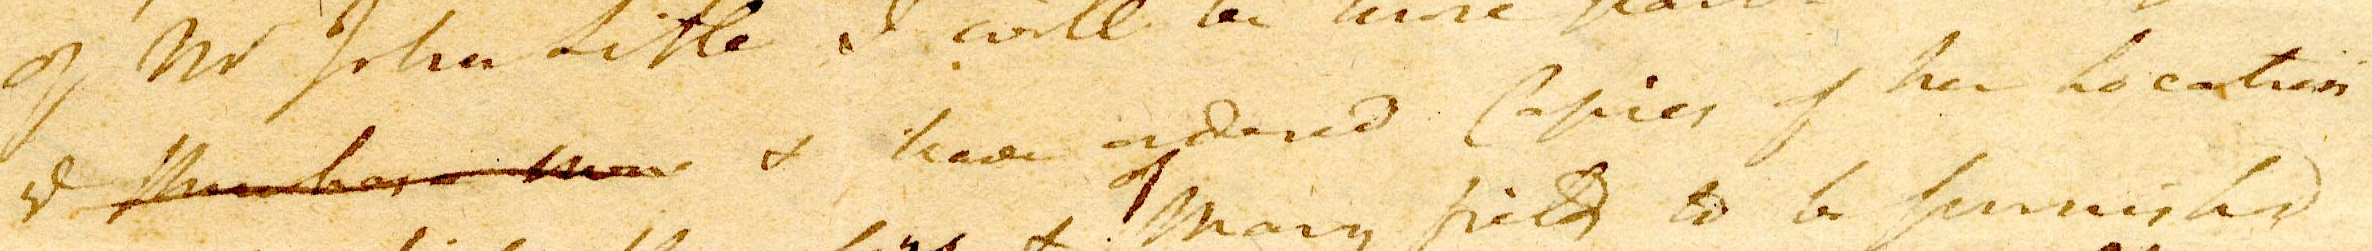y^e she has now & have ordered Copies of her Location
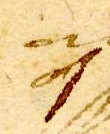of
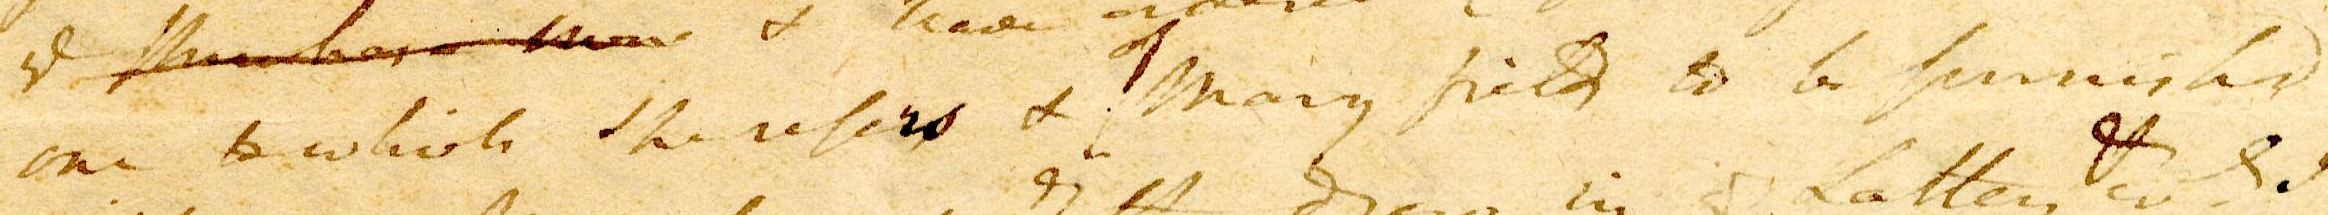one of which she refers & ^ Mary fields to be furnished
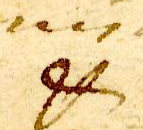&
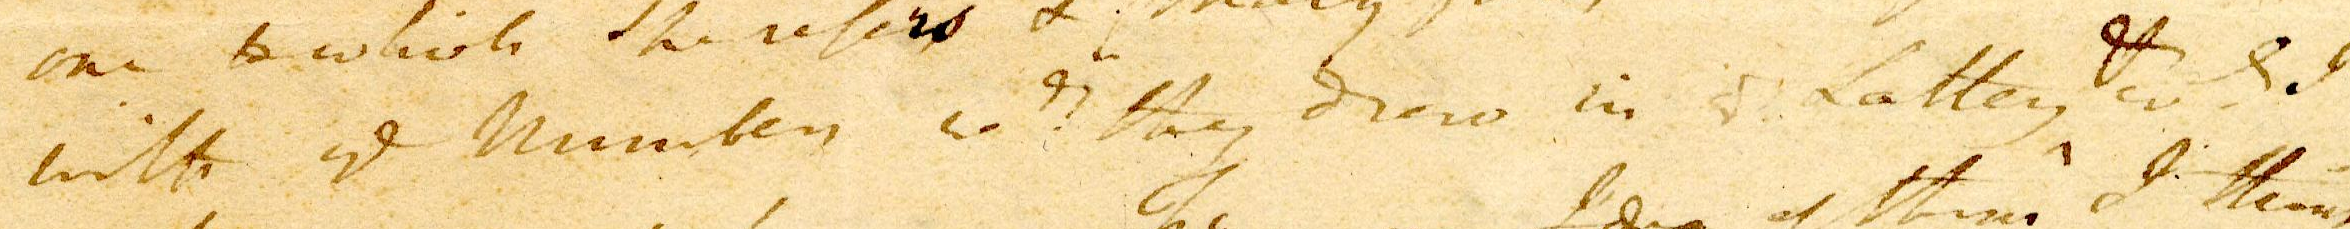with y^e Numbers w^h. they draw in y^e Latter ^ I
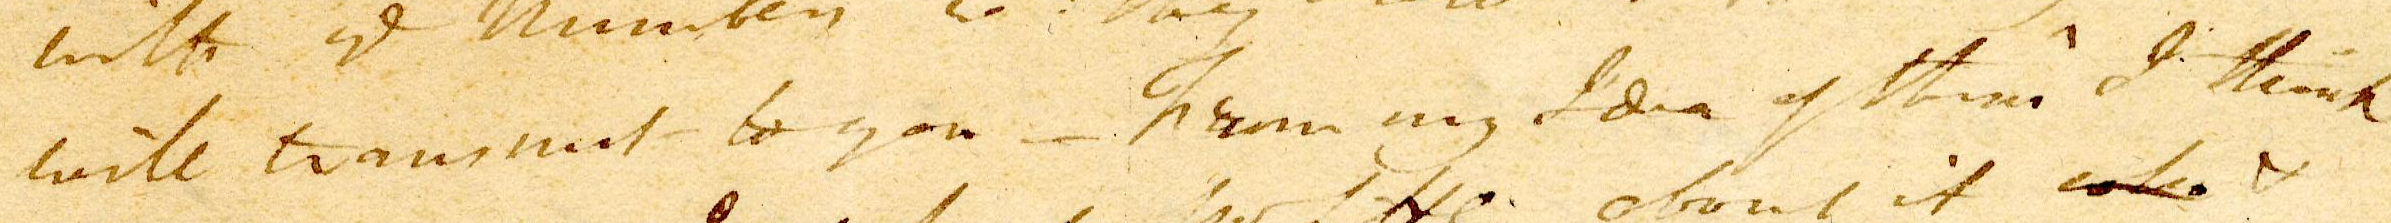will transmit to you. From my Idea of these I think
